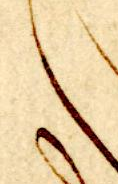To
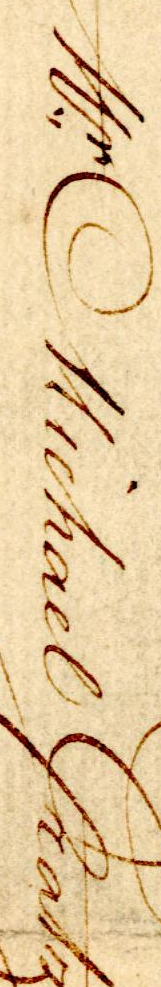M^r Michael Gratz
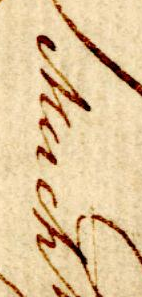Merch^t
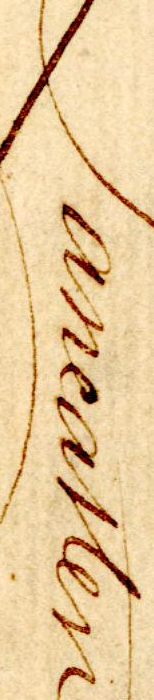Lancaster
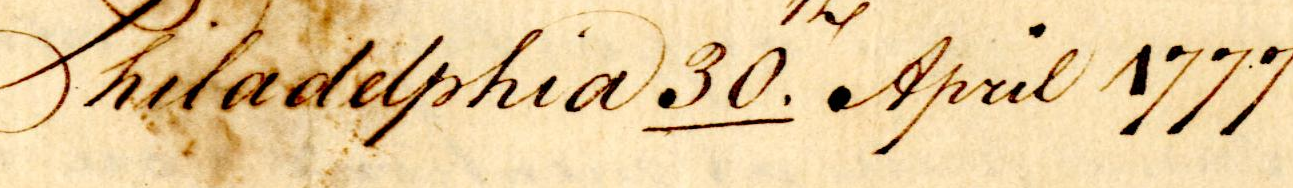Philadelphia 30^th. April 1777
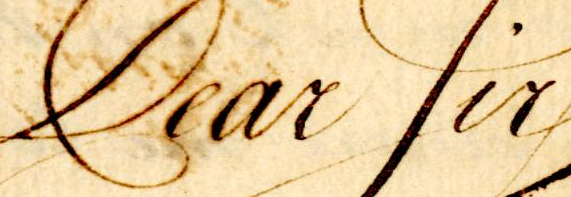Dear Sir
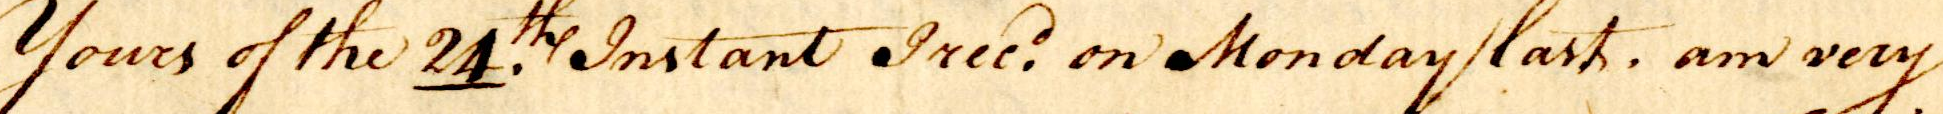Yours of the 24^th Instant I rec^d on Monday last, am very
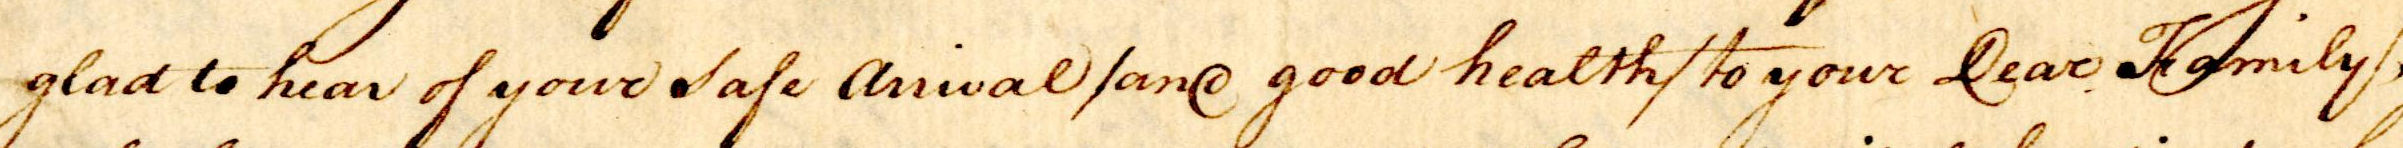glad to hear of your Safe Arrival / and good health / to your Dear Family
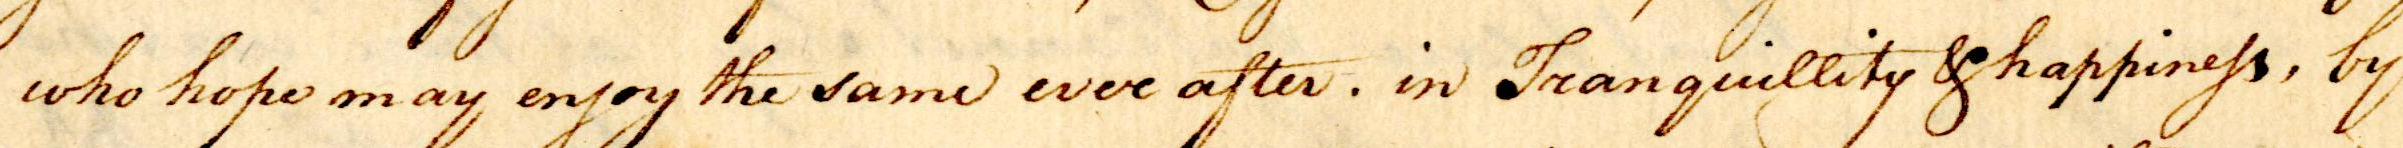who hope may enjoy the same ever after. in Tranquility & happiness, by
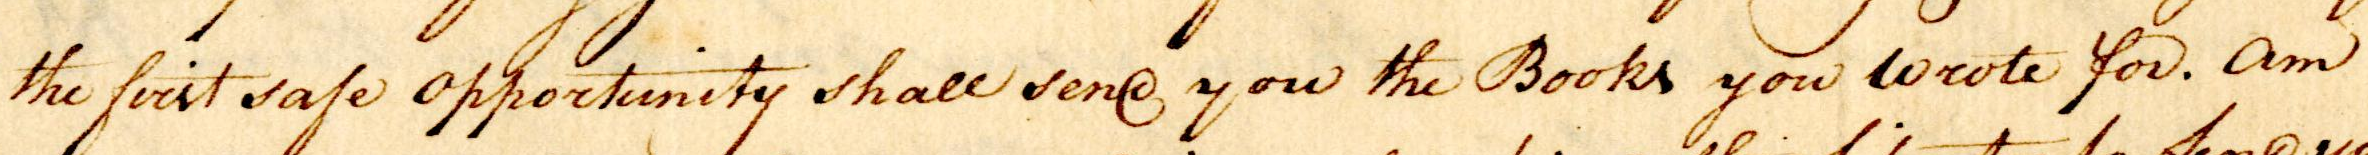the first safe opportunity shall send you the Books you wrote for. Am
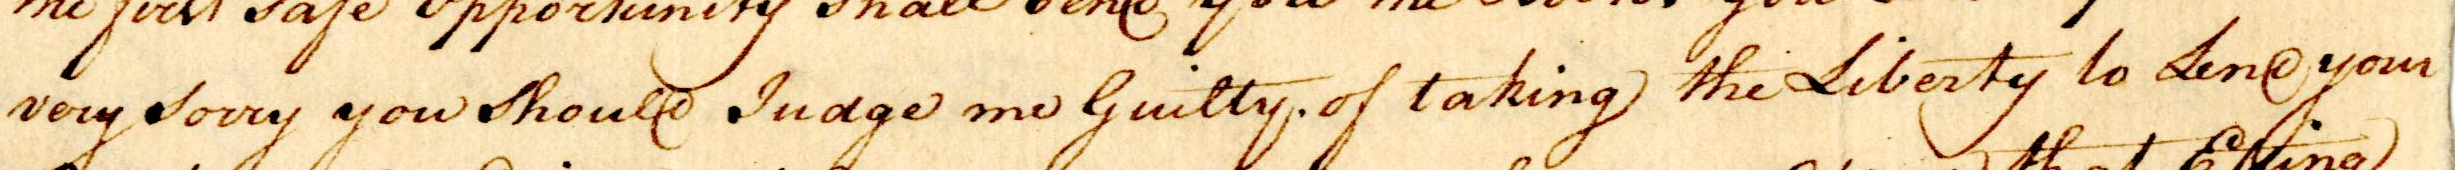very sorry you should Judge me Guilty of taking the Liberty to send your
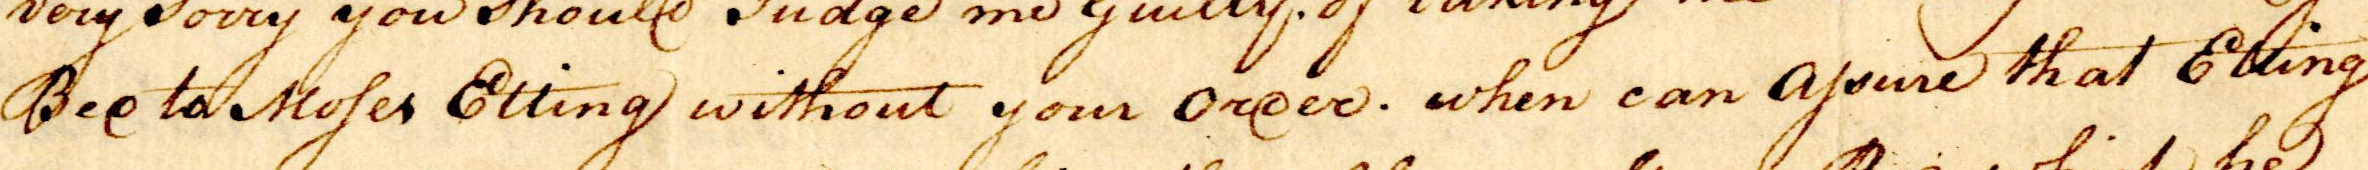Bed to Moses Etting without your order. when can assure that Etting
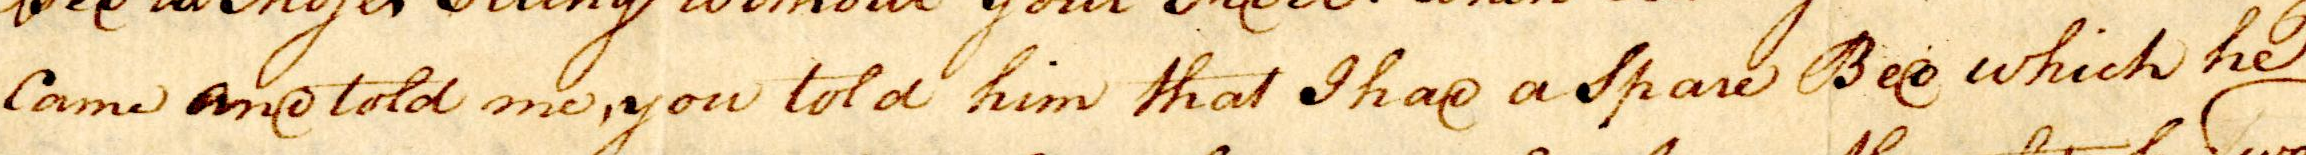Came and told me you told him that I had a spare Bed, which he
